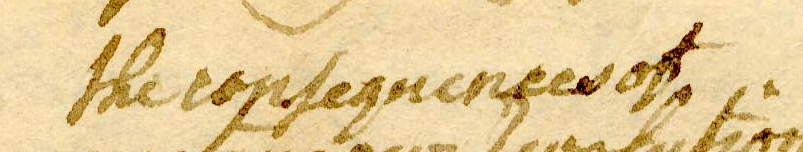the consequences of
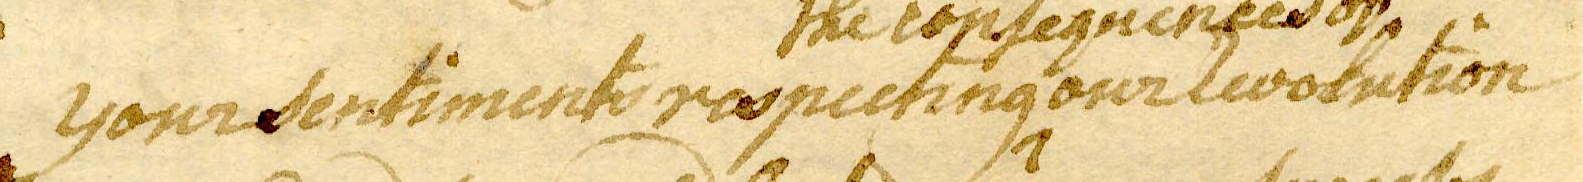Your sentiment respecting ^ our Revolution
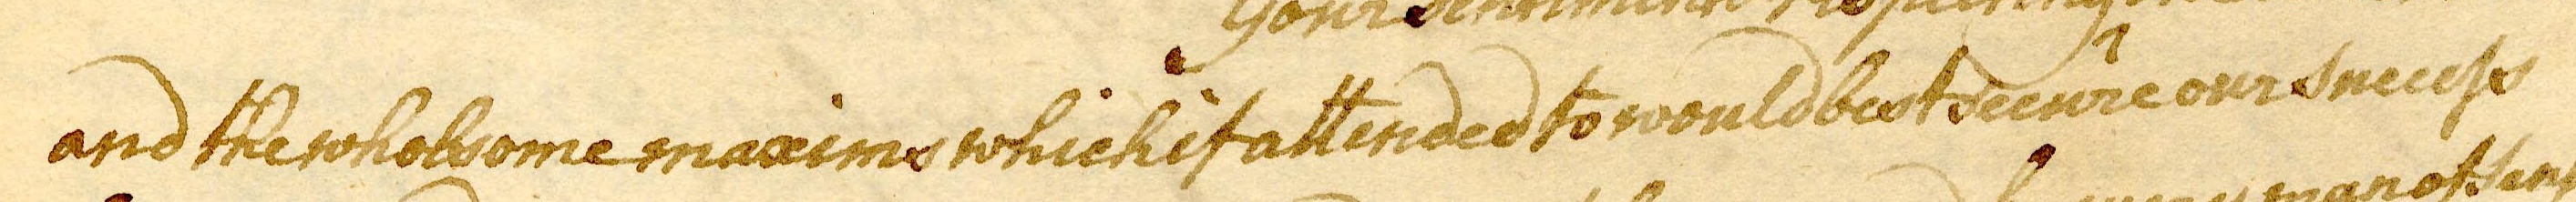and the wholsome maxims which if attended to would best secure our Success
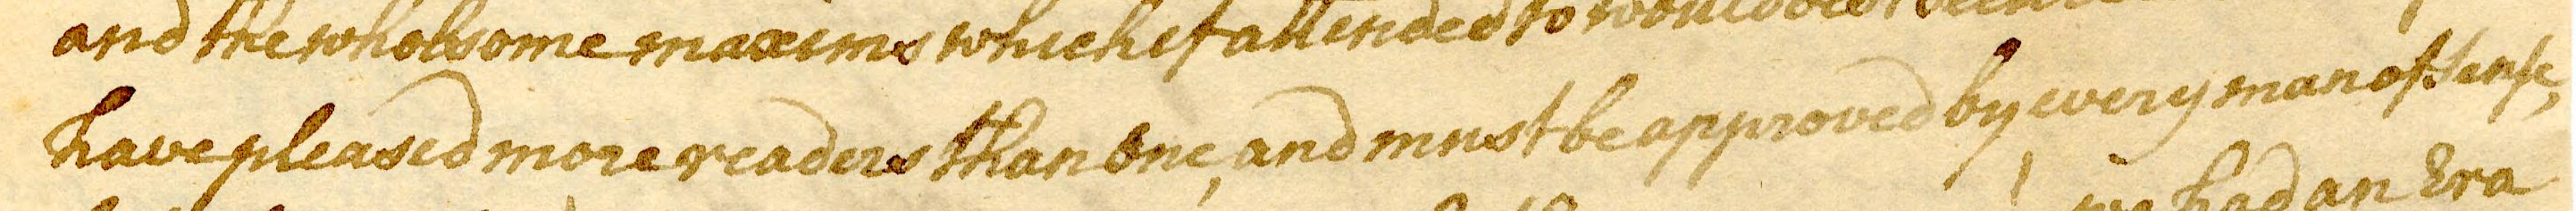have pleased more readers than one, and must be approved by every man of sense,
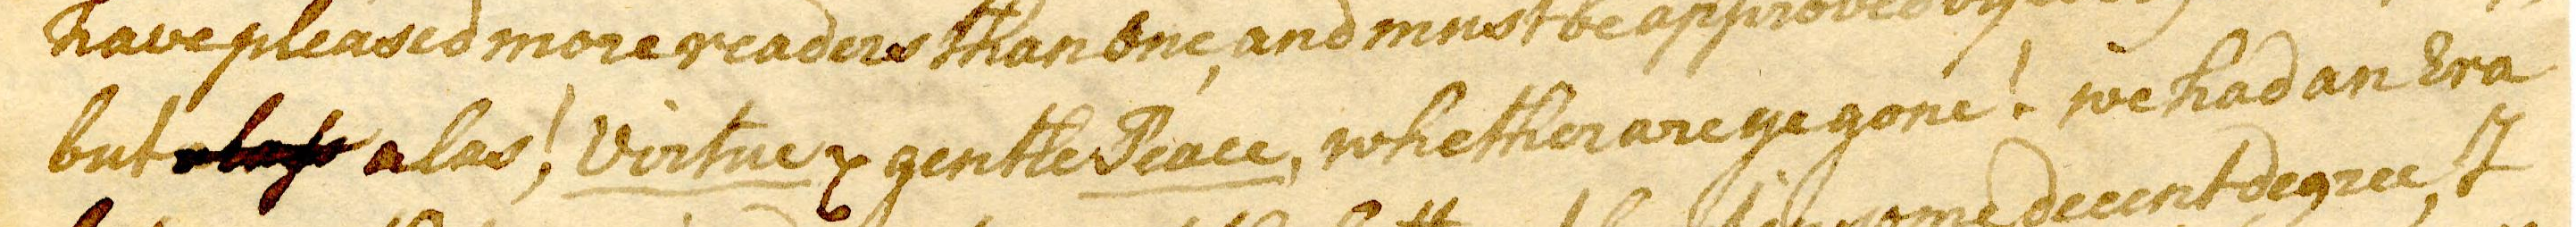but [alas] alas! Virtue & gentle Peace, whether are ye gone! we had an Era
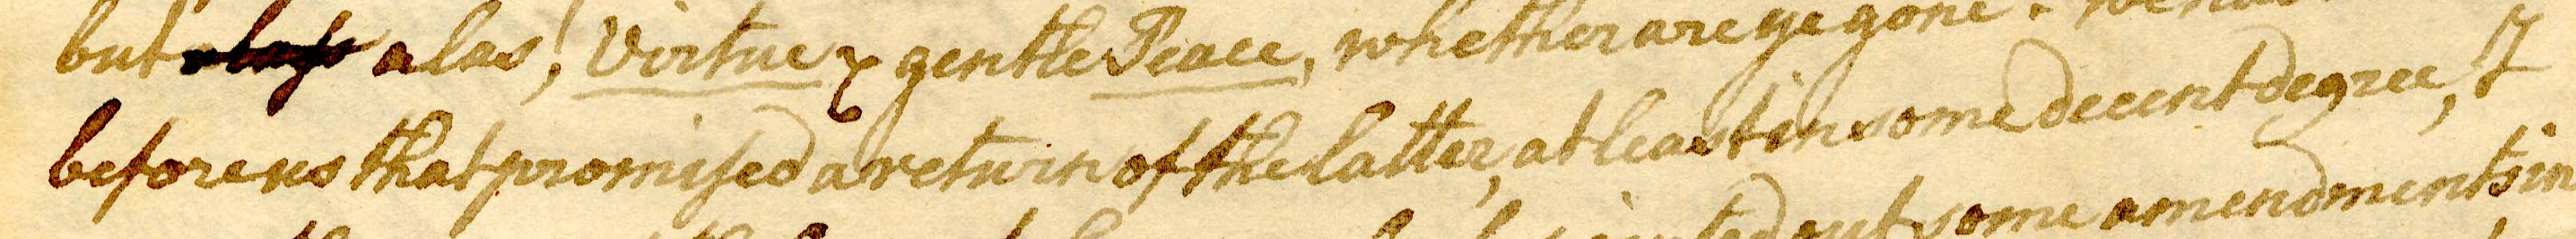before us that promised are twin of the latter, at least in some decent degree, I
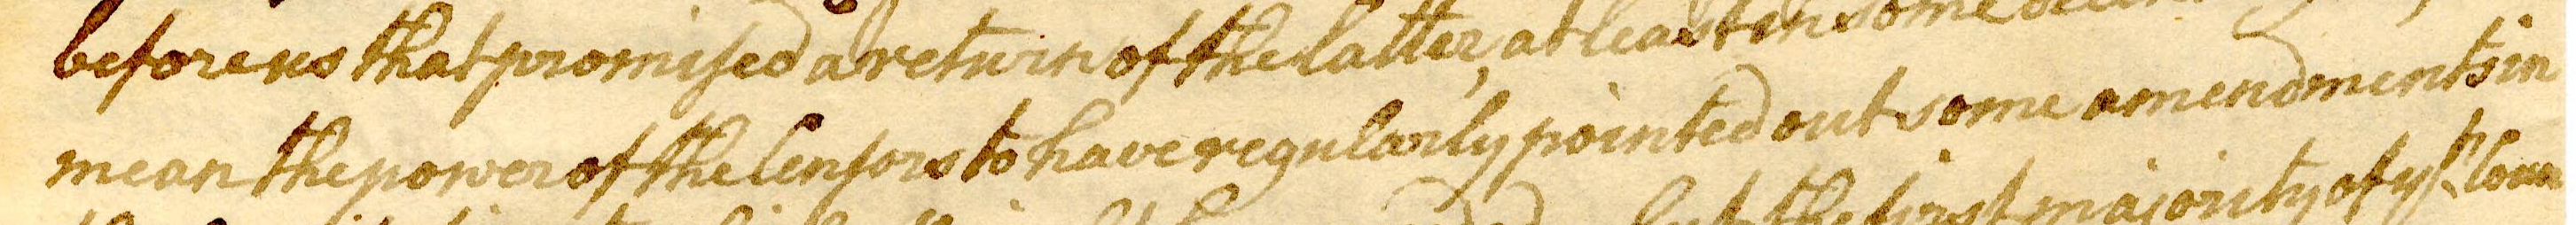mean the power of the Censors to have regularly pointed out some amendments in
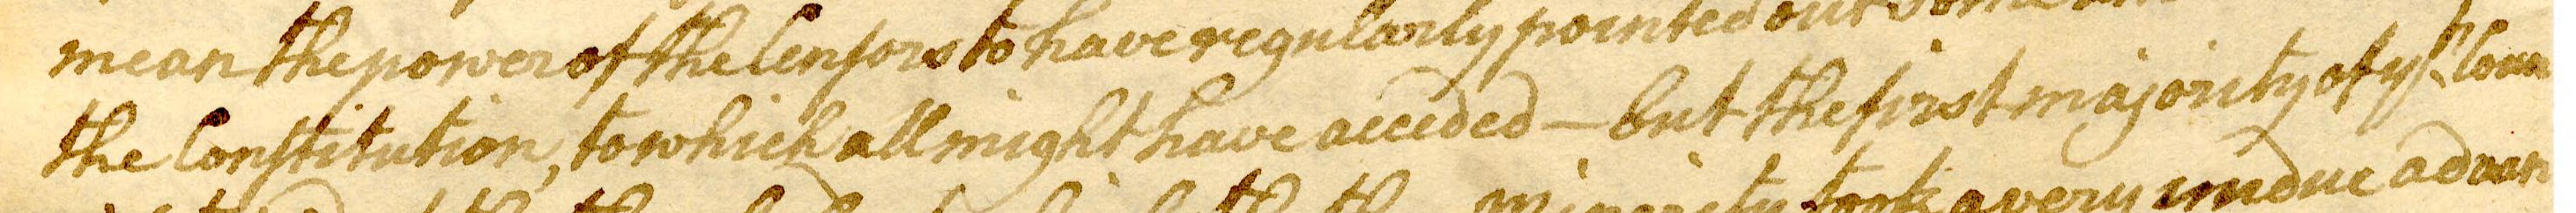the Constitution, to which all might have acceded- but the first majority of y^e Coun
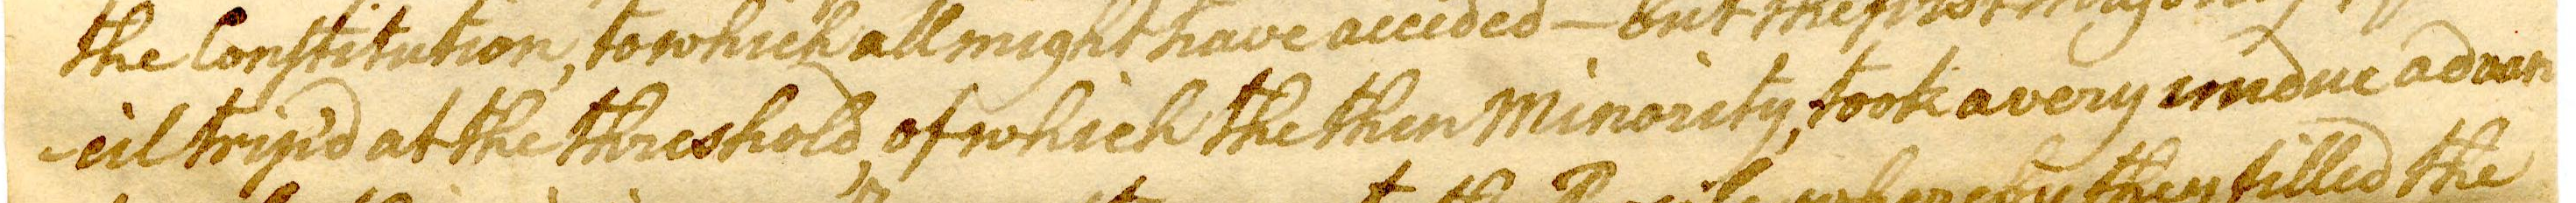-cil trip'd at the threshold, of which the then Minority, took a very undue advan
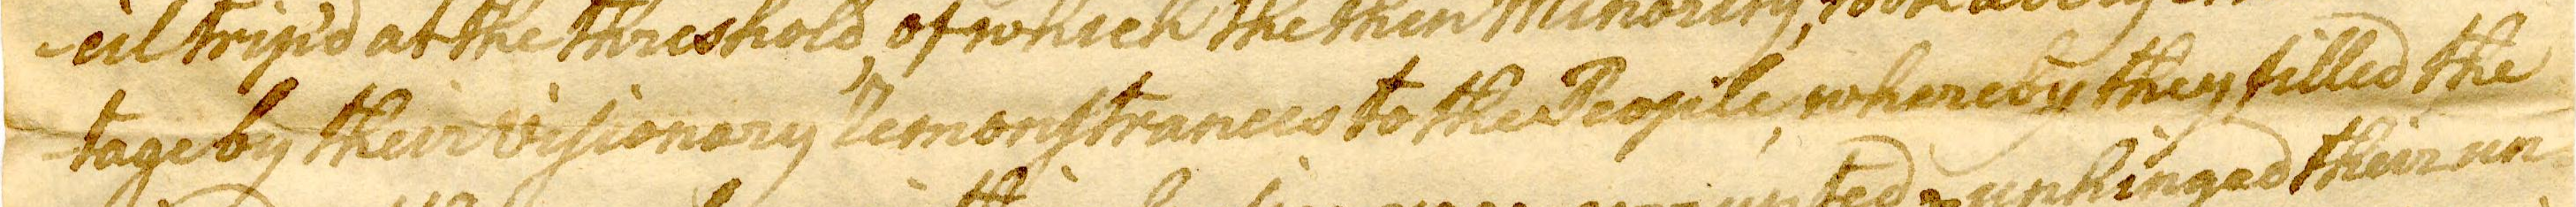-tage by their visionary remonstrances to the People, whereby they filled the
